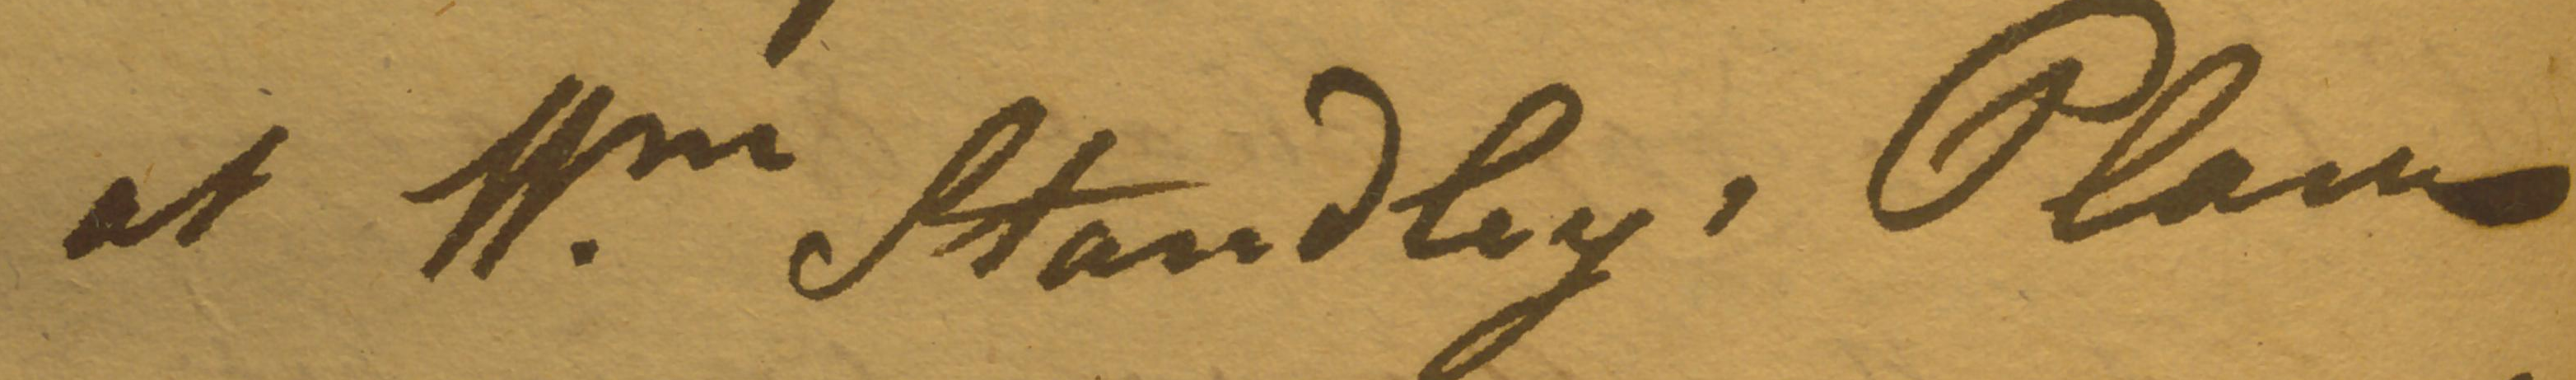at W^m. Standleys Plan
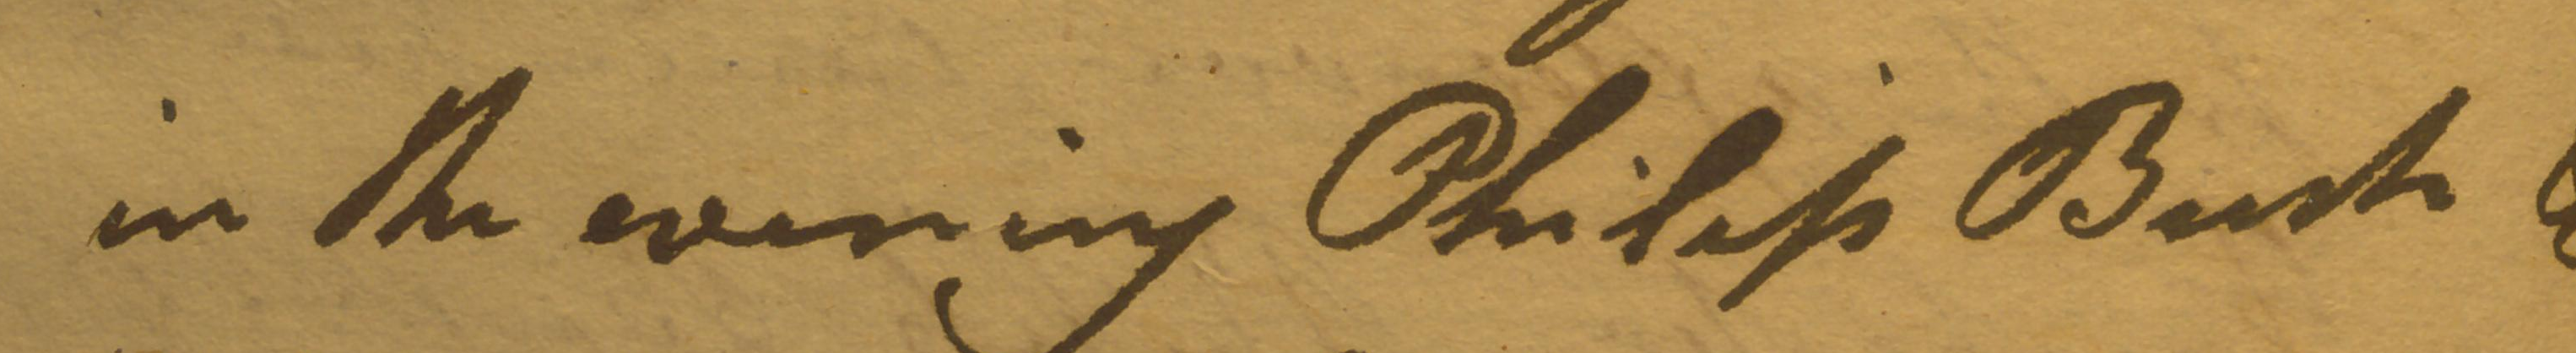in the evening Philips Bush &
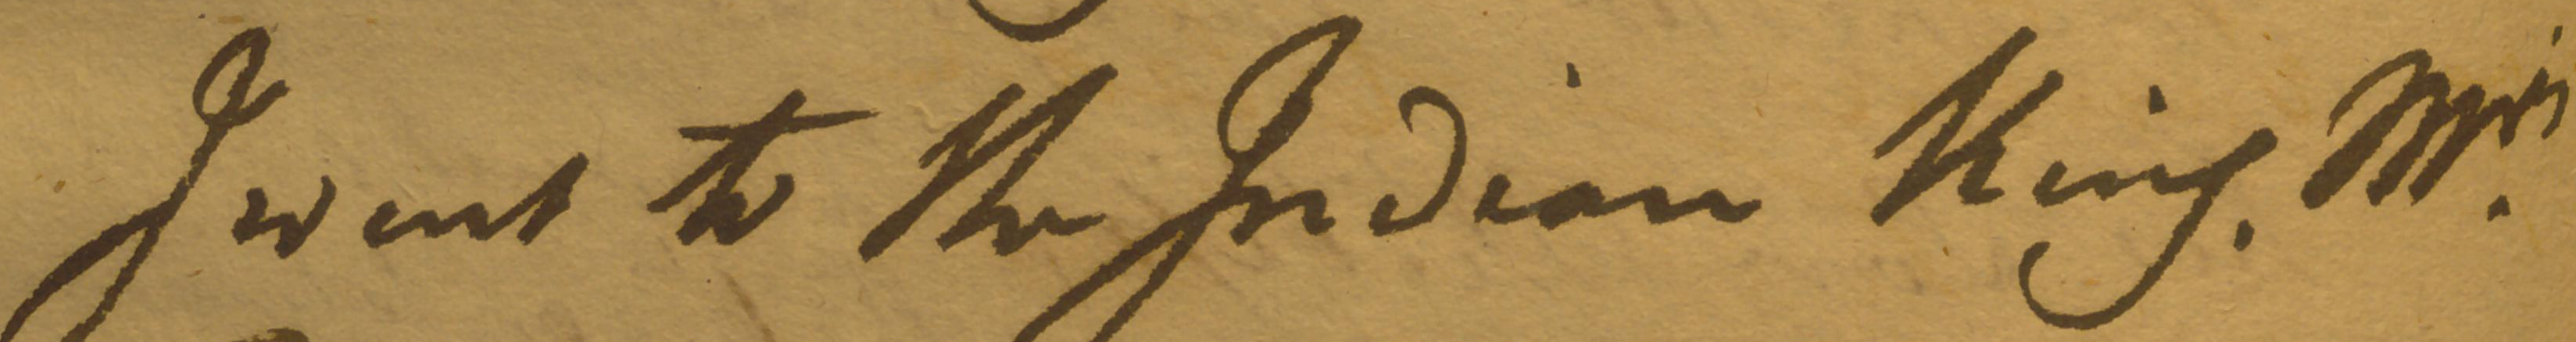I went to the Indian King M^r.
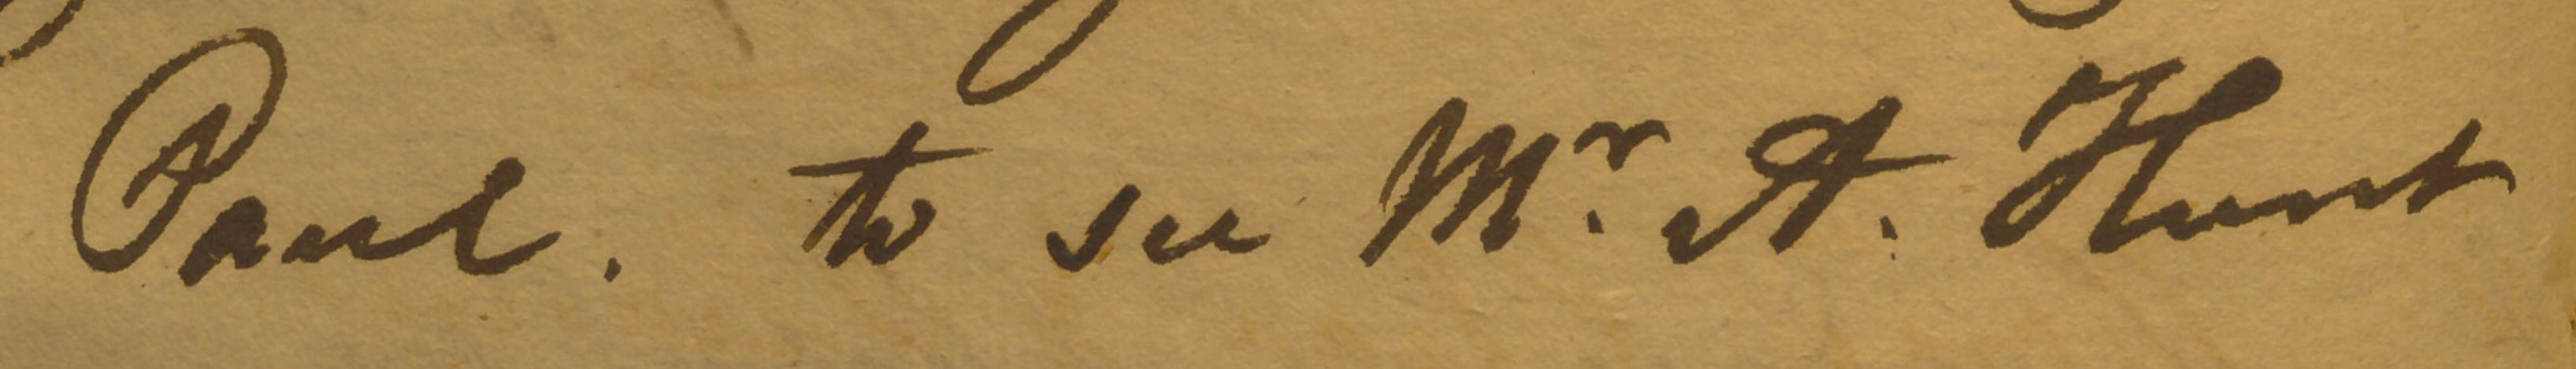Paul, to see M^r. A. Hunt
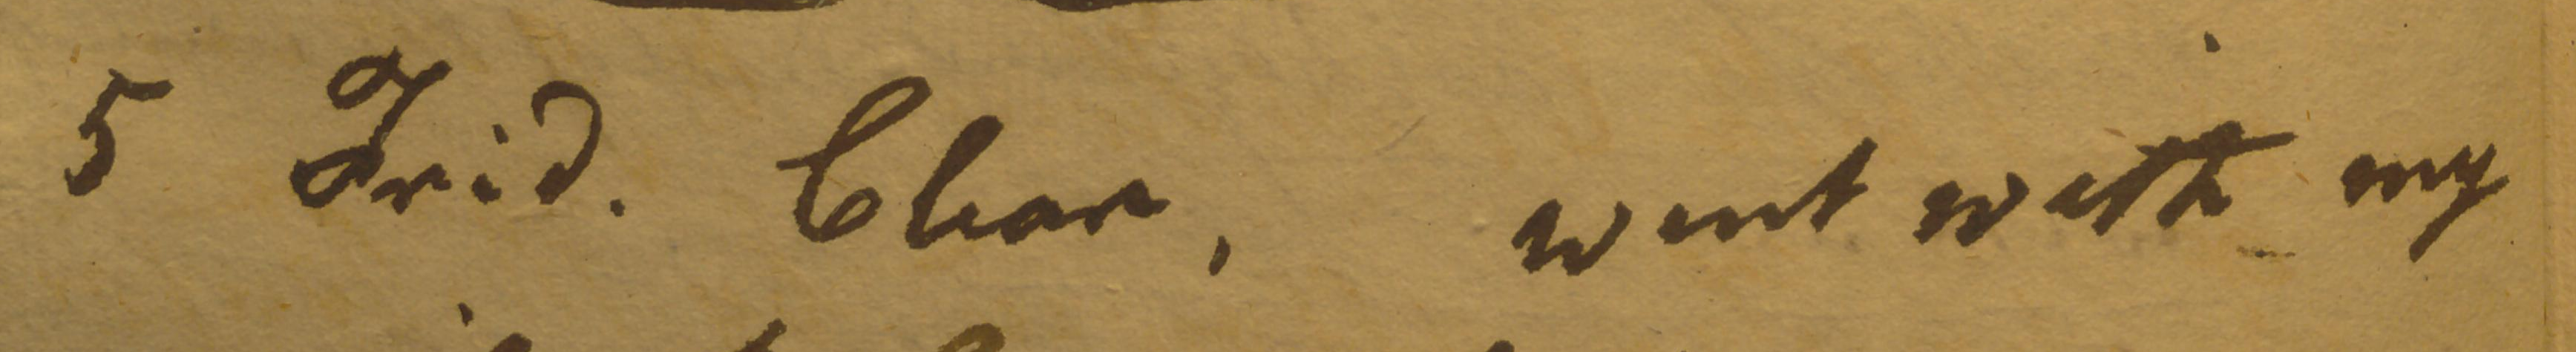5 Frid. Clear went with my
